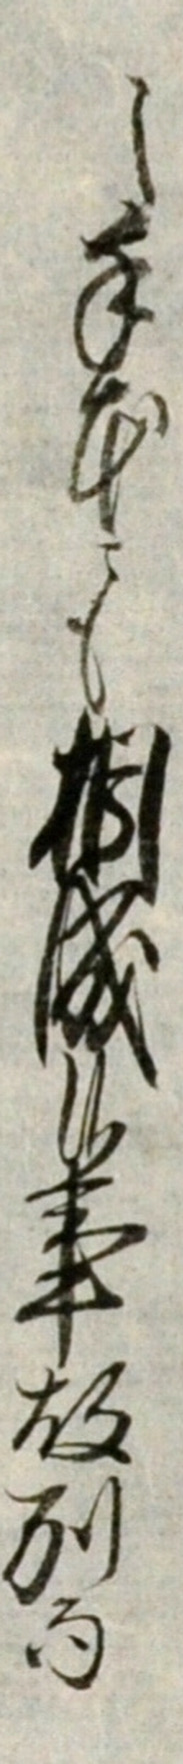之手本にも相成候殊故列而
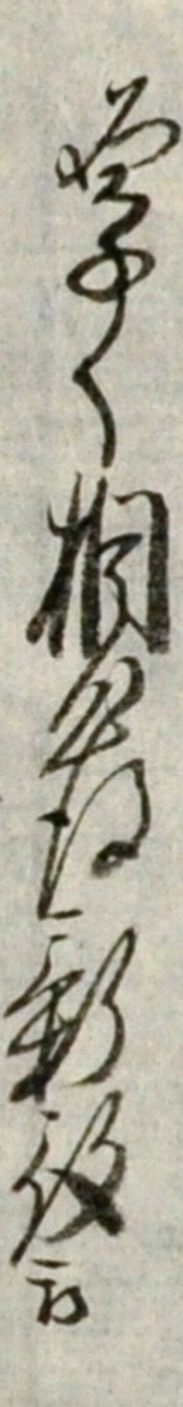厚く相心得新役被
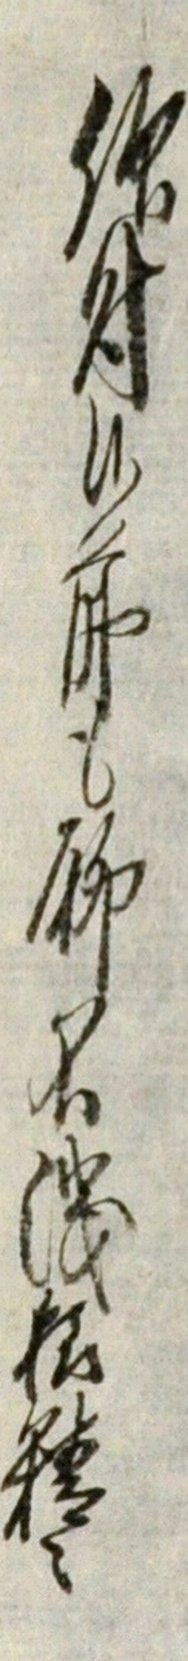仰付候節も聊不浅様精々
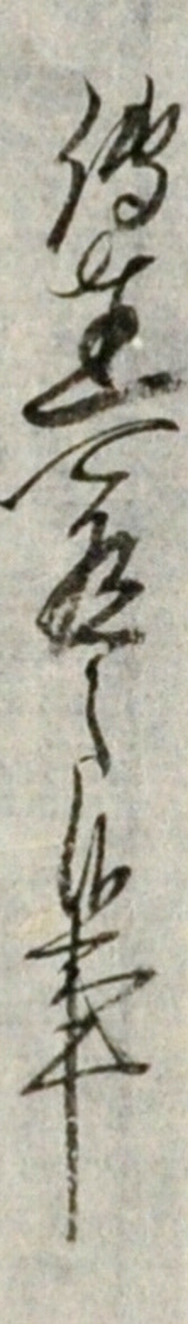伝達可有之候事
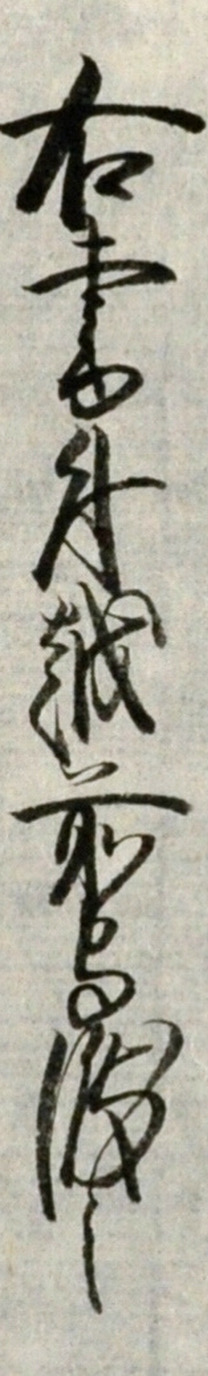右書付越前守渡之
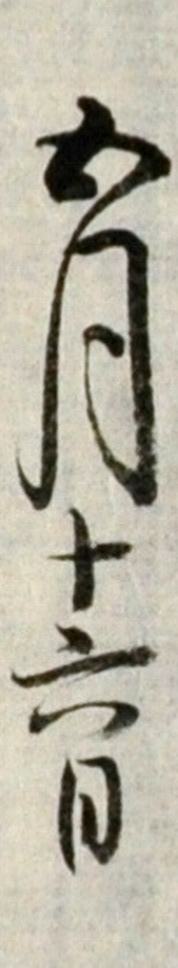五月十六日

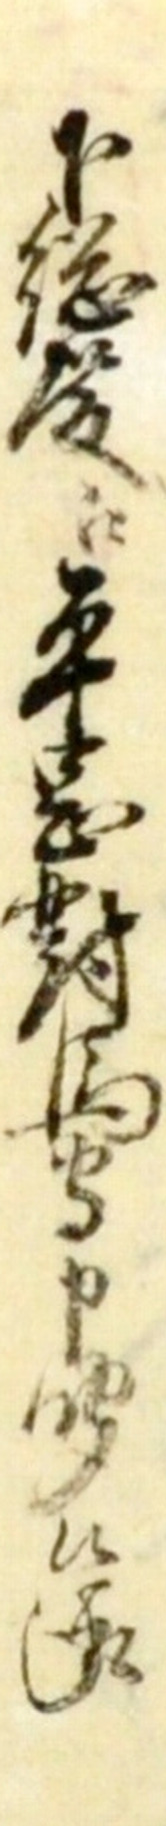下総殿江平岡対馬守申聞候趣

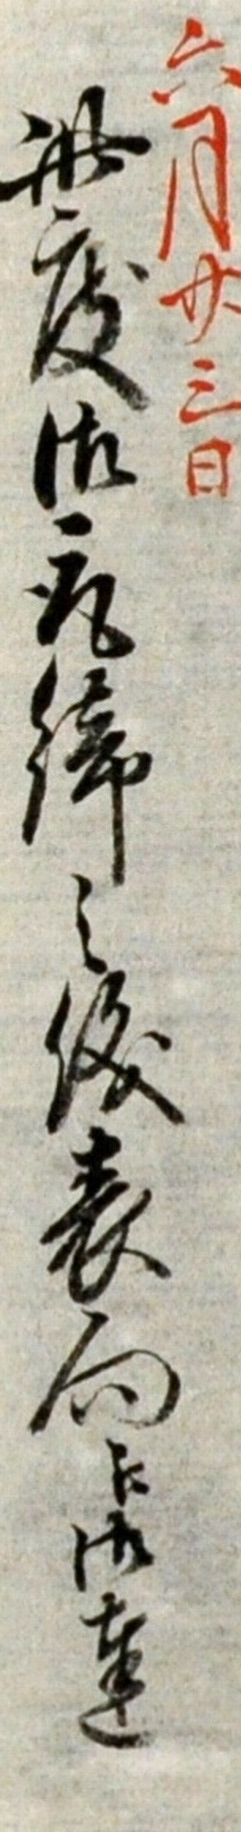此度御取締之儀表向江御達
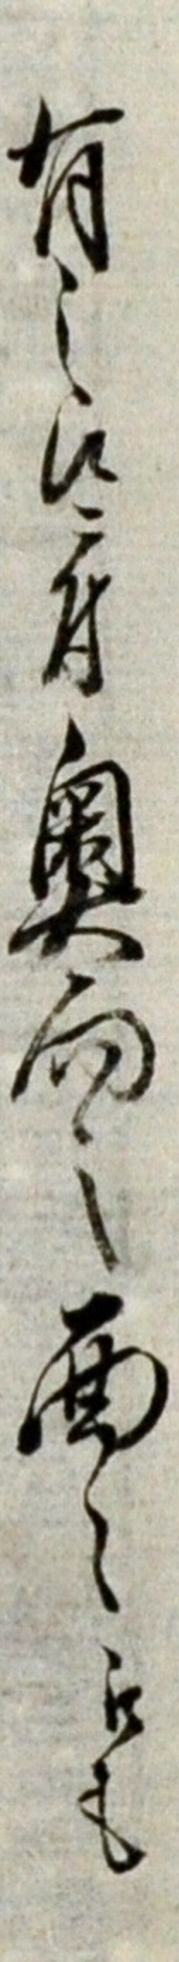有之候付奥向之面々江も
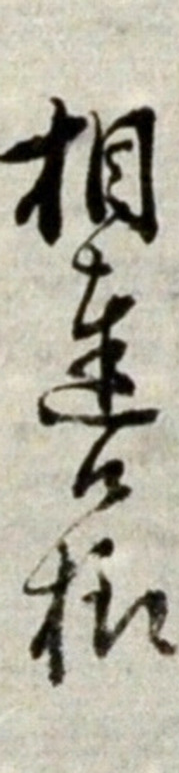相達候様
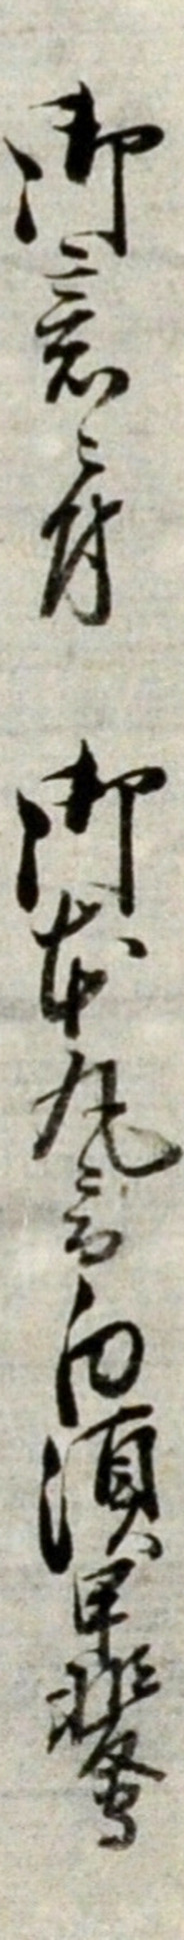御意付御本丸而白須甲斐守
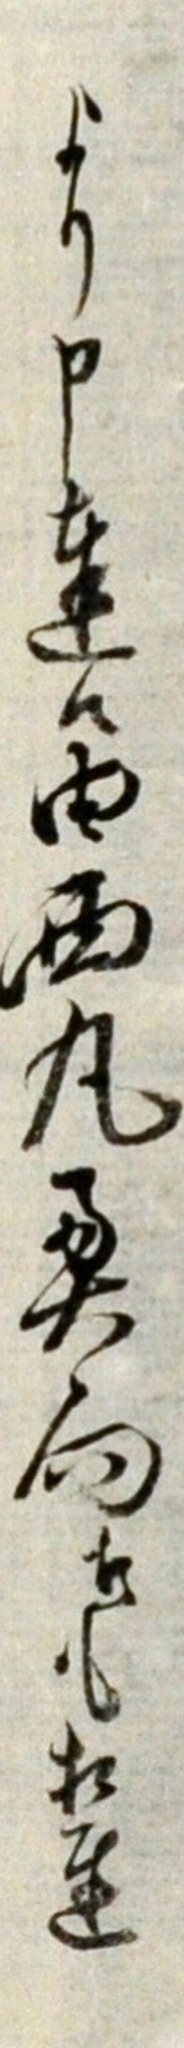より申達候由に西丸奥向江も相達
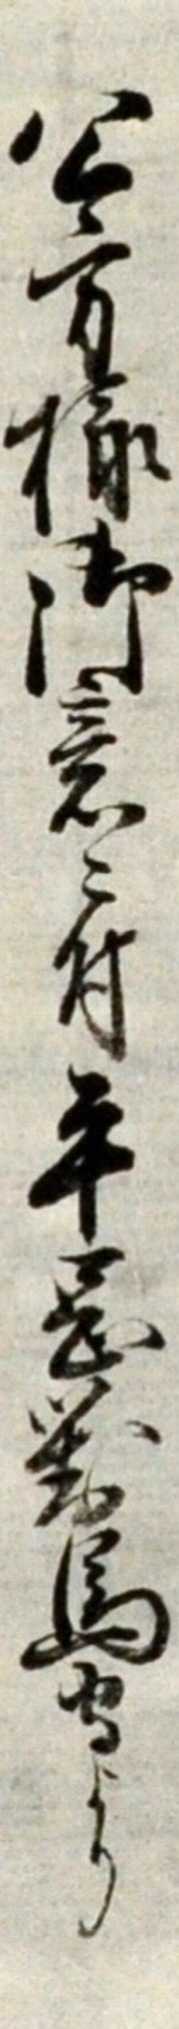公方様御意付平岡対馬守より
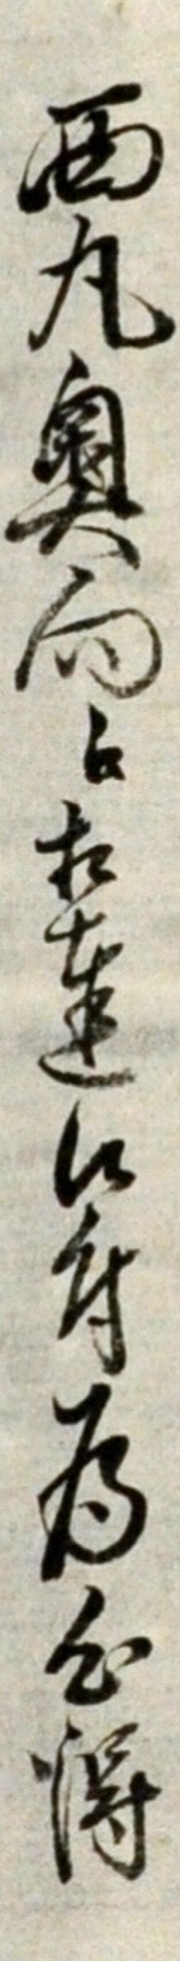西丸奥向江相達候付為心得
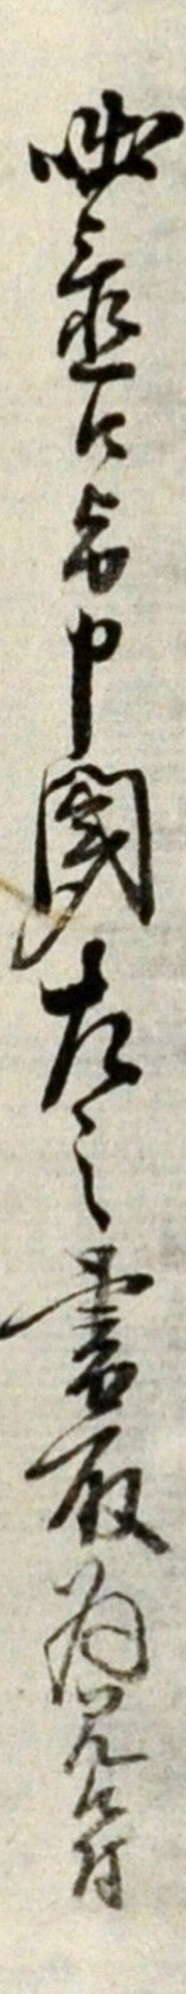咄置候旨申左之書取為見候付
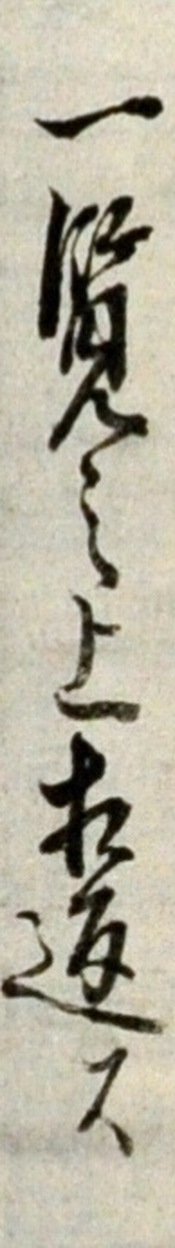一覧之上相返
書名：若年寄御役中御調書付
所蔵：伊那市立高遠町図書館・合同会社AMANE
